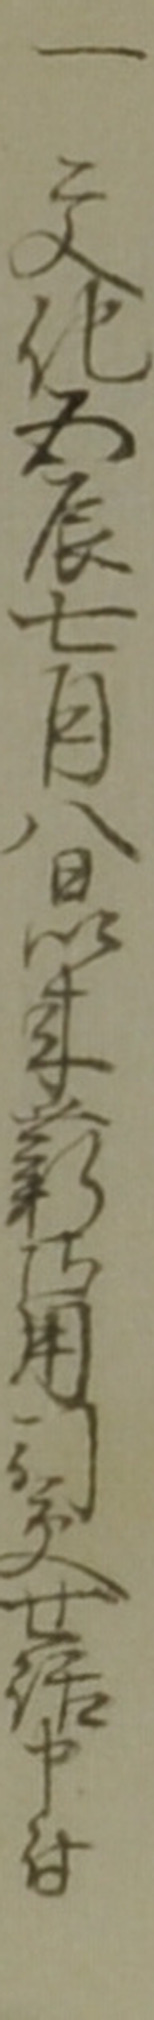一文化五辰七月八日以来新御用引受世話申付
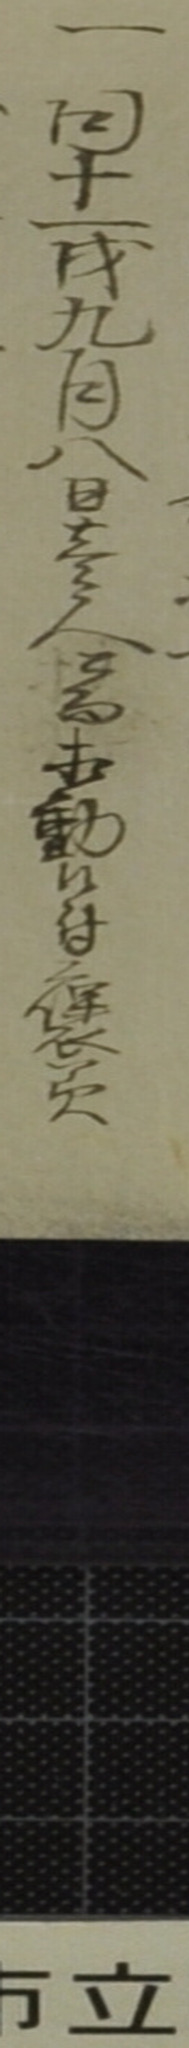一同十一戌九月八日壱人ニ而相勤候付褒美
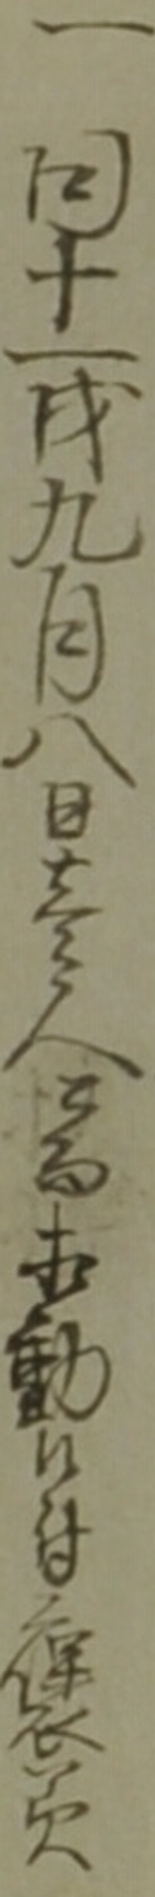一同十一戌九月八日壱人ニ而相勤候付褒美
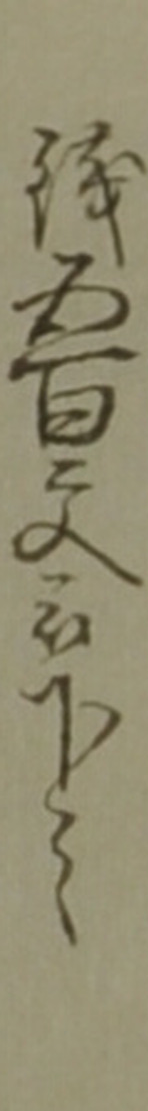銭五百文被下之
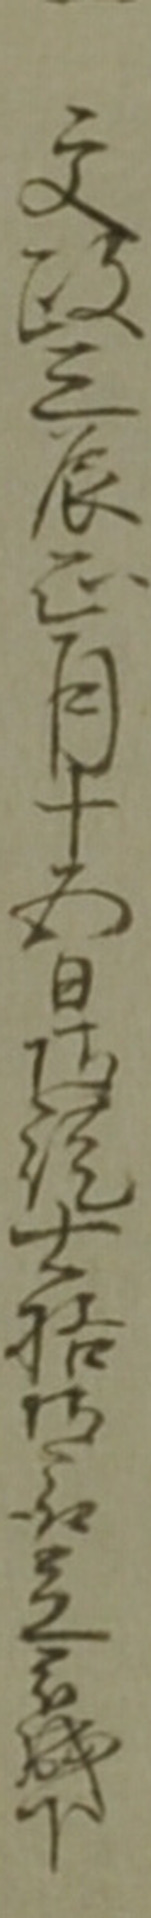一文政三辰正月十五日御徒士格御取立被成下
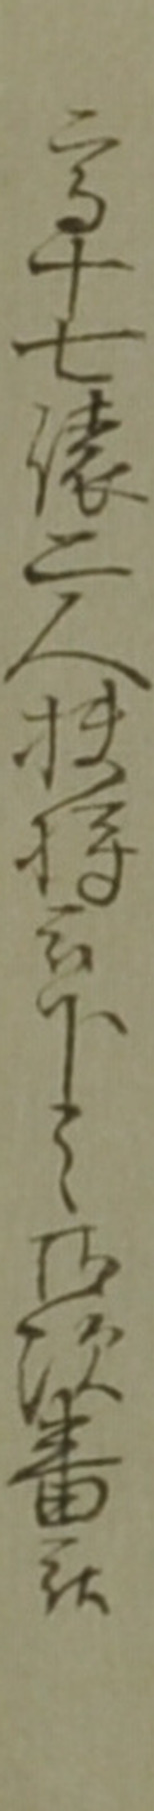高十七俵二人扶持被下之御次番被
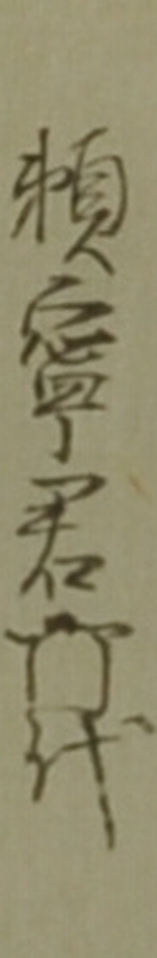頼寧君御代
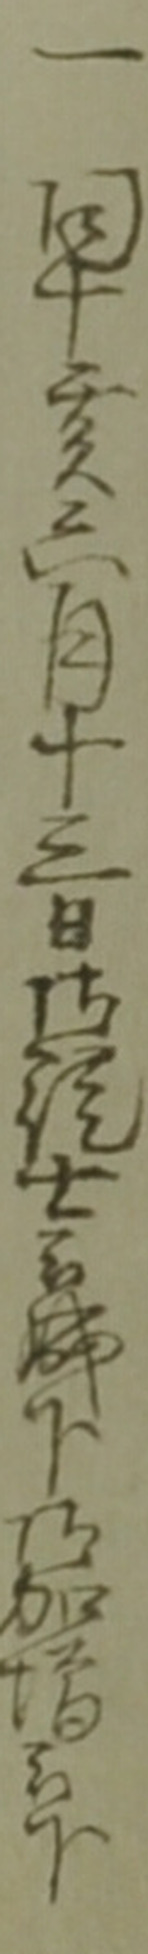一同十亥年六月十三日御徒士被成下御加増被下
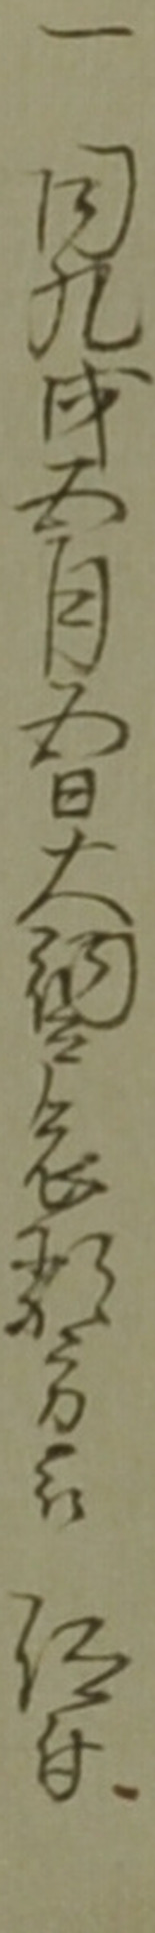一同九戌五月五日大納戸衣類方被仰付
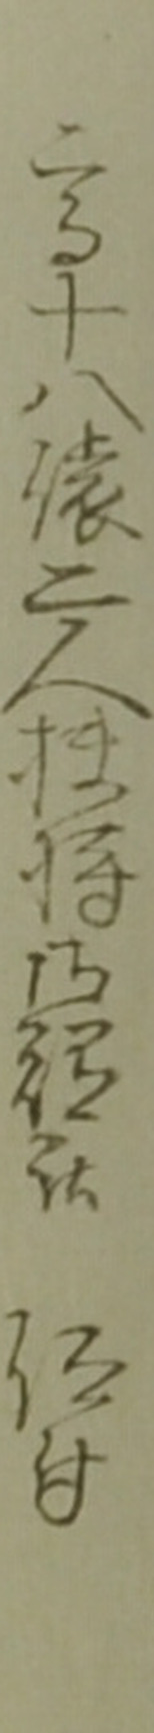高十八俵二人扶持御賄被仰付
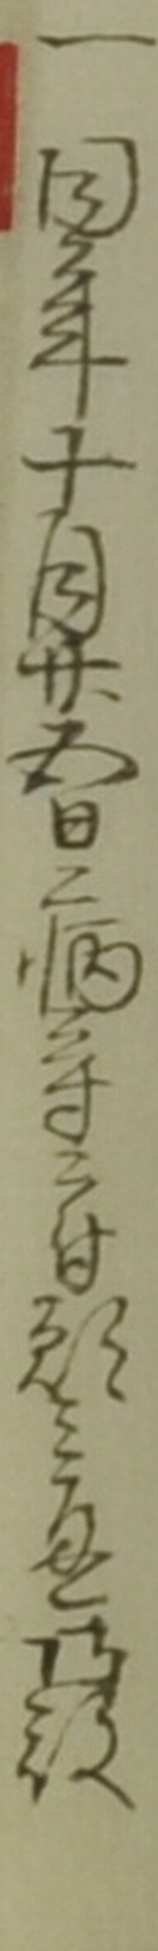一同年十月廿五日病気ニ付願之通御役

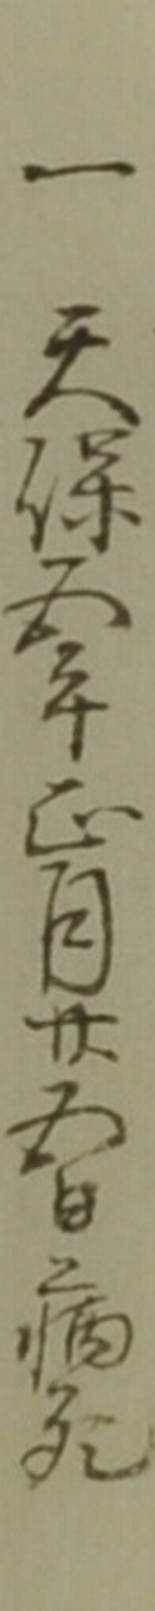一天保五午正月廿五日病死
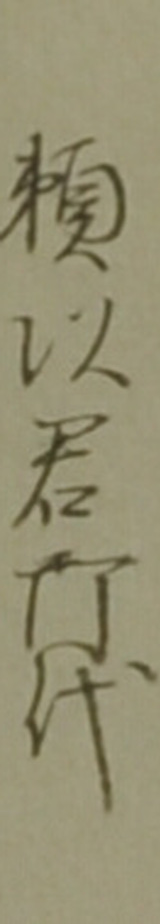頼以君御代
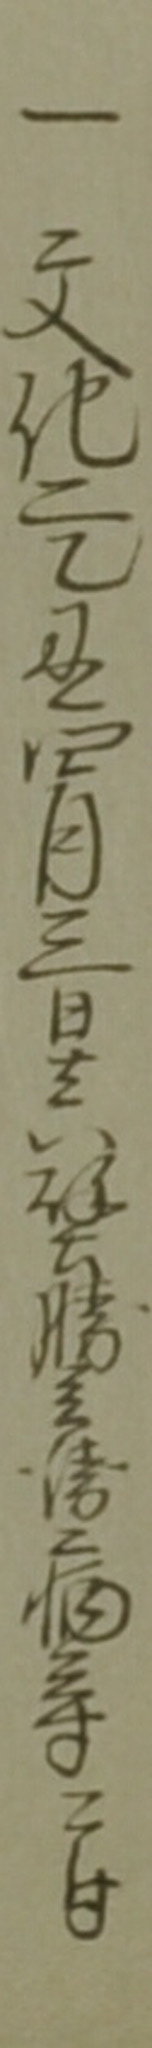一文化二乙丑四月三日真壁勝兵衛病気ニ付
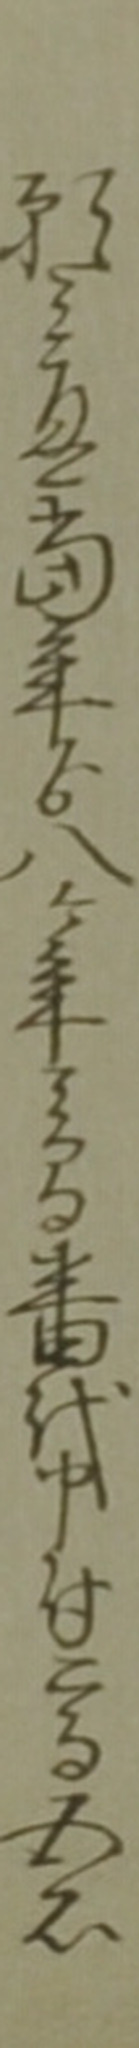願之通当年ゟ八ヶ年之間番代申付高五石
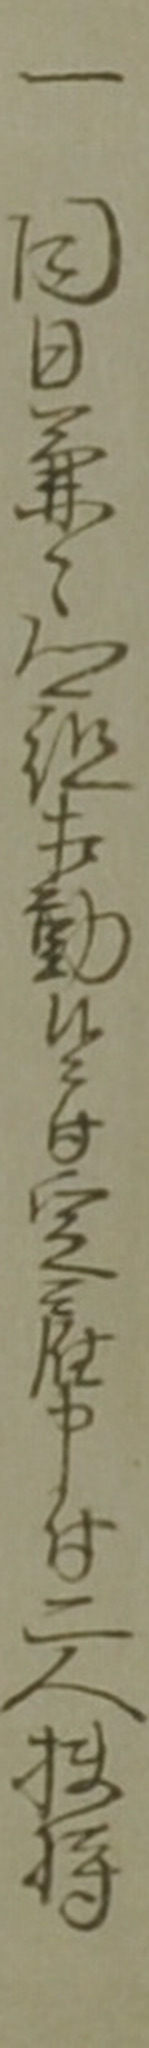一同日兼々郷組相勤候ニ付定雇申付二人扶持
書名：無足諸士勤仕録（六）
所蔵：伊那市立高遠町図書館・合同会社AMANE
